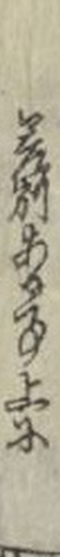差別ある事上に
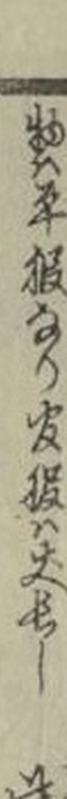物は平服なり官服は丈長し
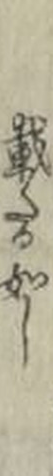載たる如し
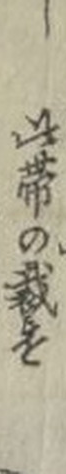此帯の裁を
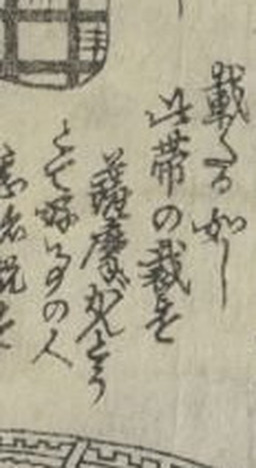薩摩がんとう
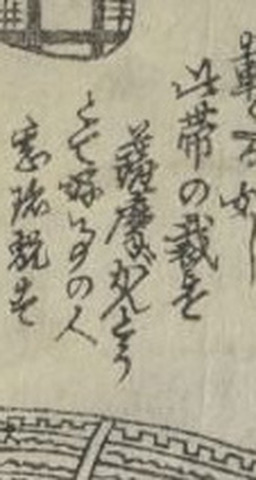薩摩がんとう
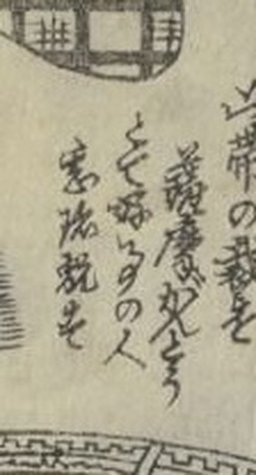とて好事の人
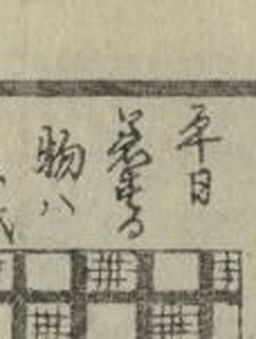着する
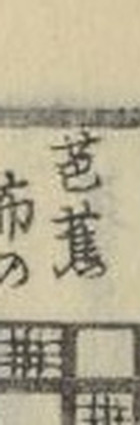芭蕉布の
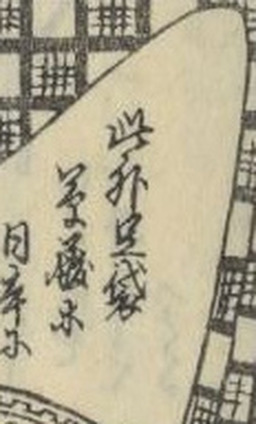此外足袋
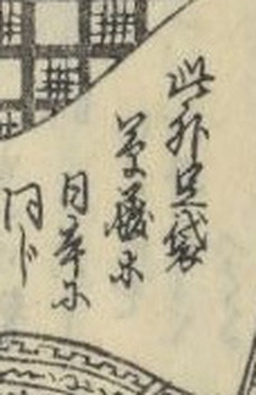草履等
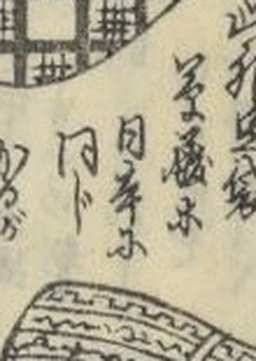日本に
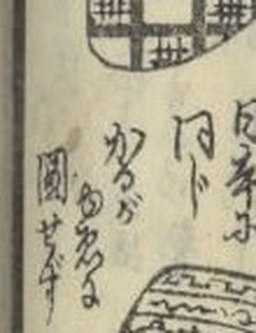かるが
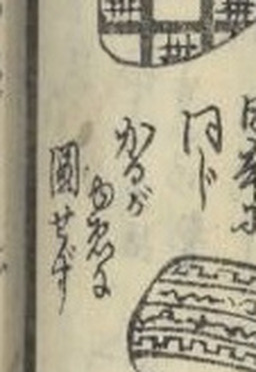かるが
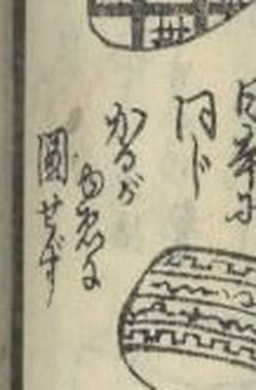かるが
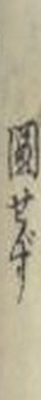図せず
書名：琉球解語
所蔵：University of the Ryukyus Library
